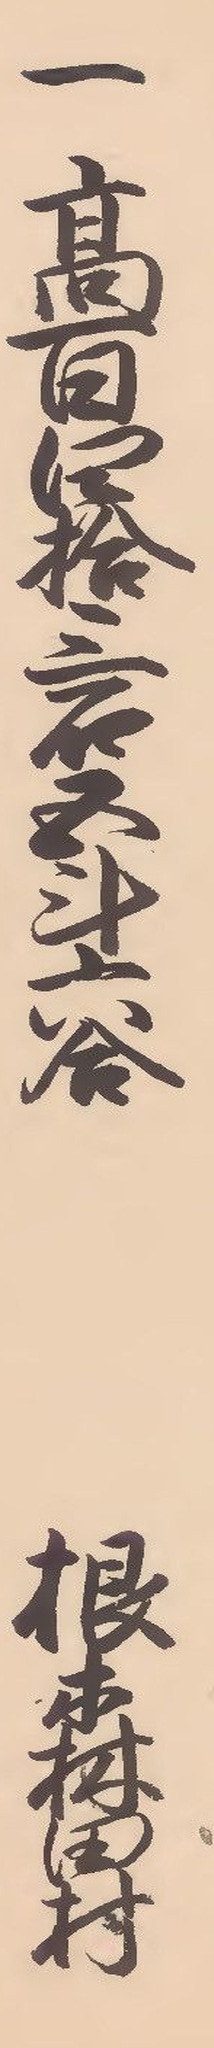一高百四拾三石五斗六合根森田村
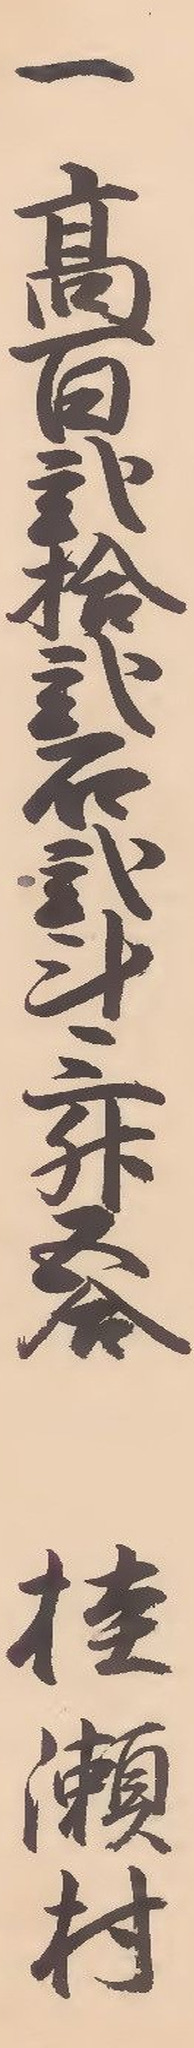一高百弐拾弐石弐斗三升五合桂瀬村

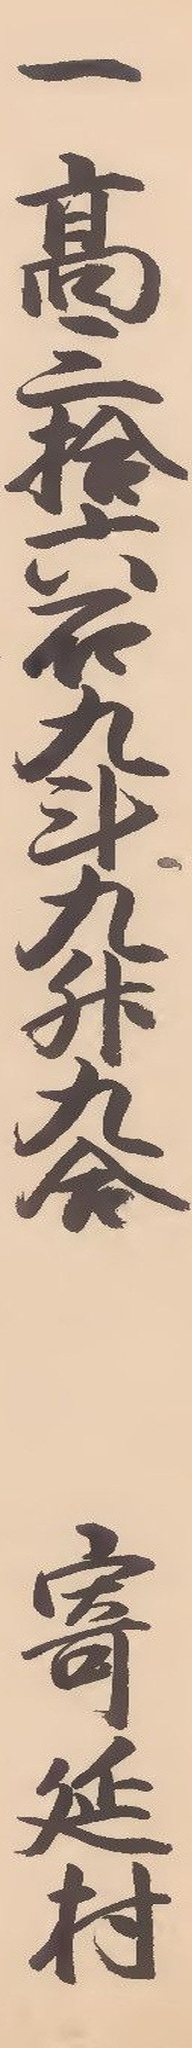一高三拾六石九斗九升九合寄延村
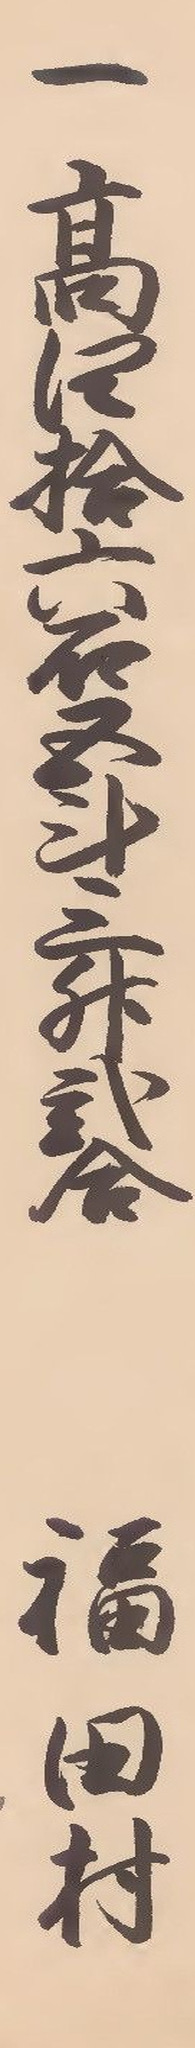一高四拾六石五斗三升弐合福田村
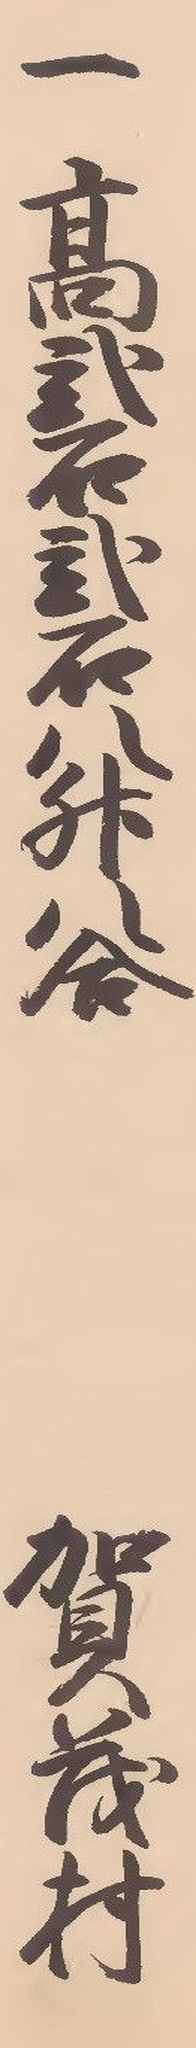一高弐石弐石八升八合賀茂村
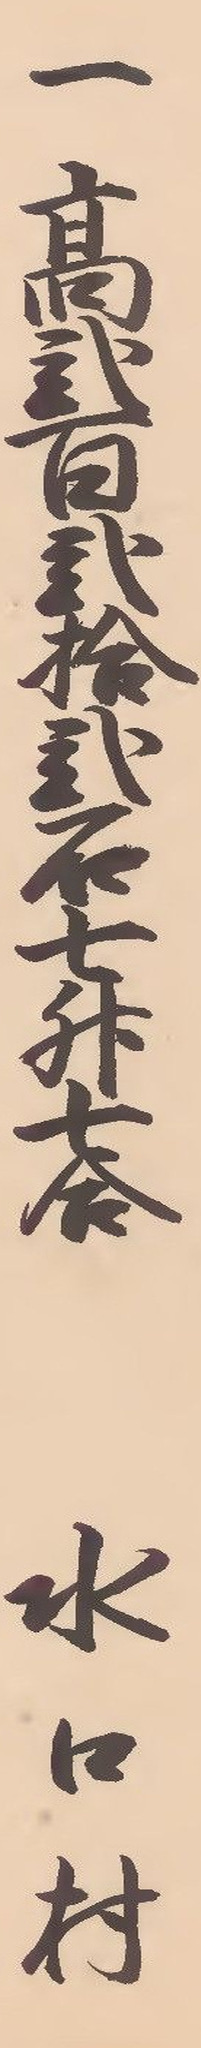一高弐百弐拾弐石七升七合水口村
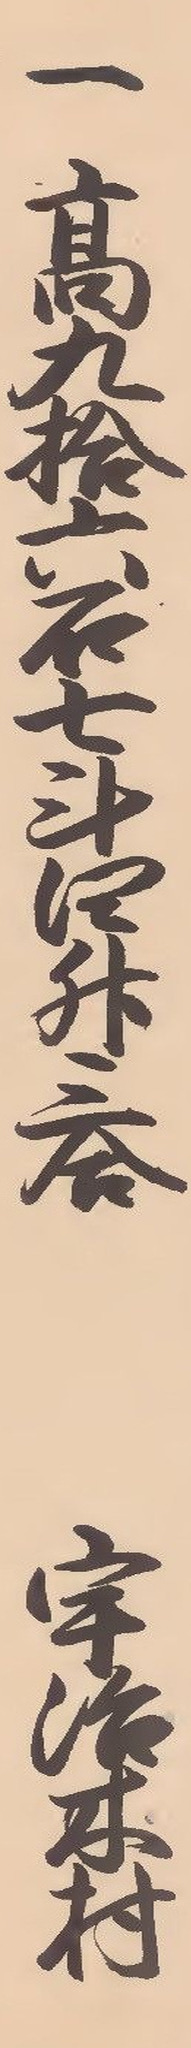一高九拾六石七斗四升三合宇治木村
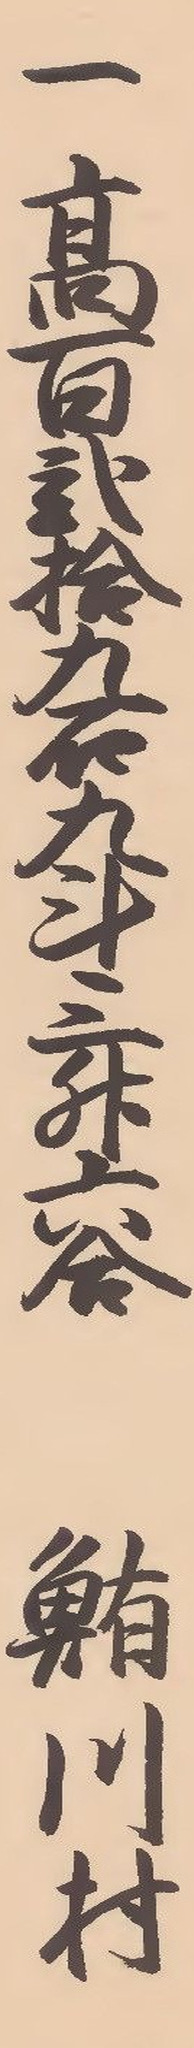一高百弐拾九石九斗三升六合鮪川村
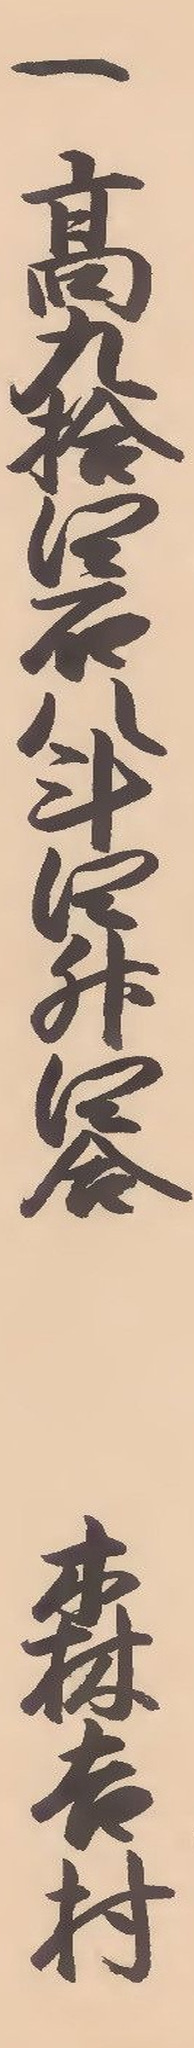一高九拾四石八斗四升四合森吉村
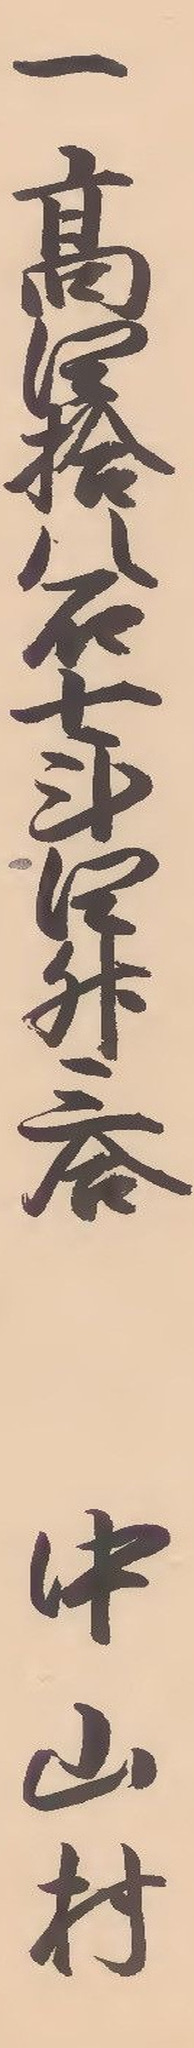一高四拾八石七斗四升三合中山村

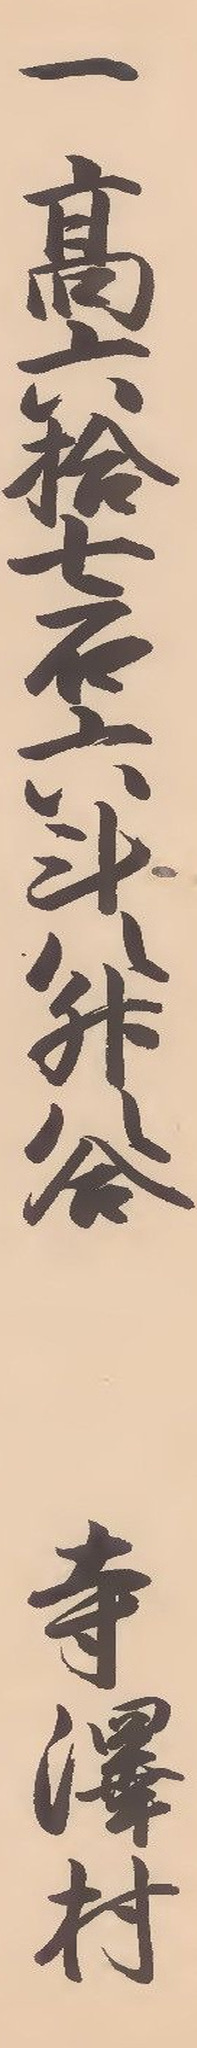一高六拾七石六斗八升八合寺沢村
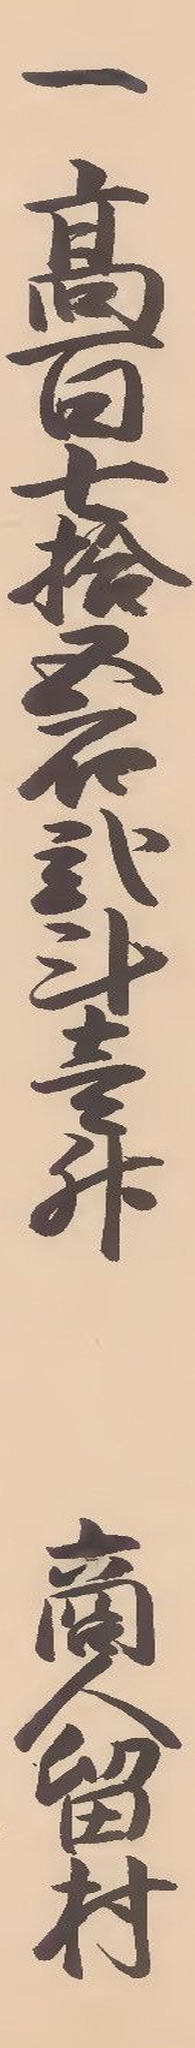一高百七拾五石弐斗壱升商人留村
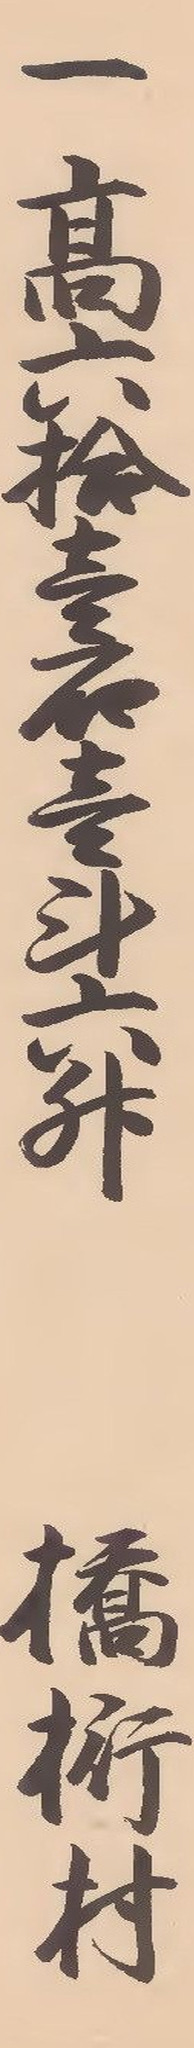一高六拾壱石壱斗六升橋桁村
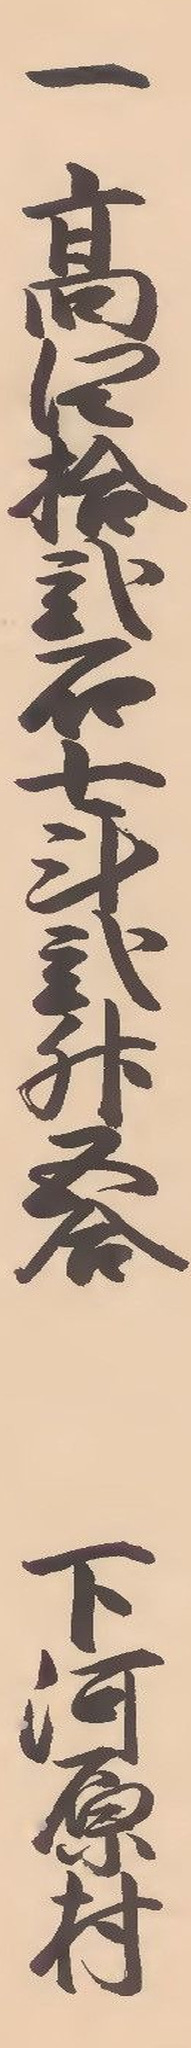一高四拾弐石七斗弐升五合下河原村
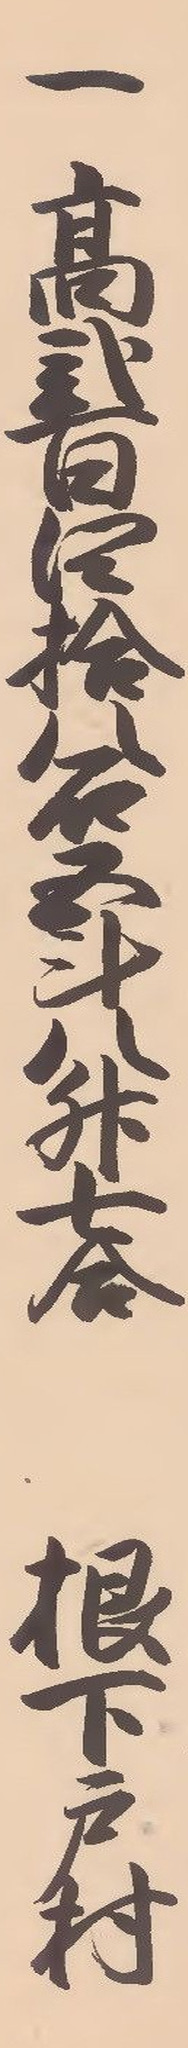一高弐百四拾八石五斗八升七合根下戸村
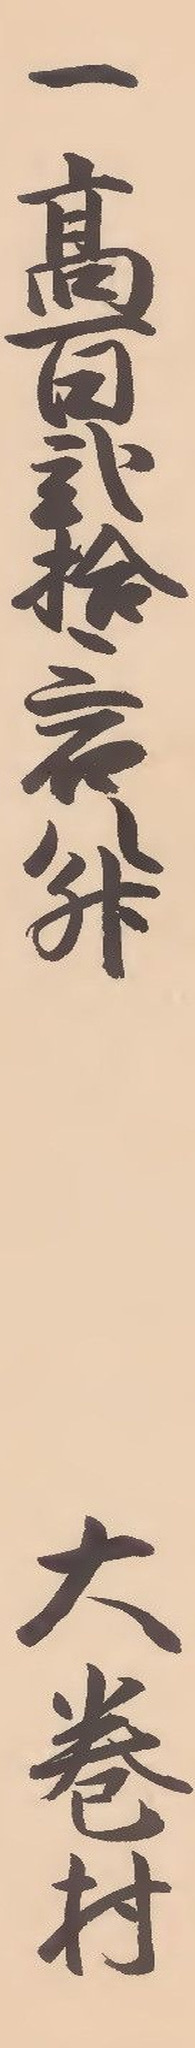一高百弐拾三石八升大巻村
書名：出羽国郷帳　５
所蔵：国立公文書館 National Archives of Japan
